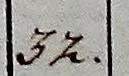32.
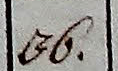36.
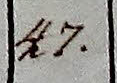47.
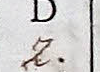2.
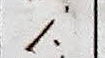1.
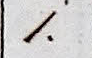1.
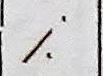1.
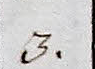3.
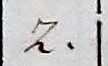2.
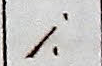1.
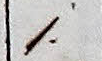1.
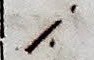1.
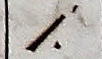1.
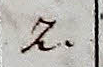2.
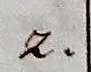2.
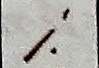1.
